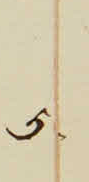5
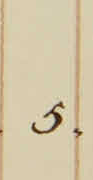5
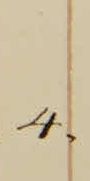4
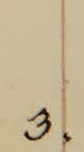3
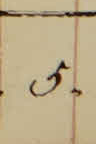5
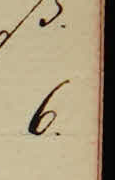6.
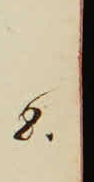8.
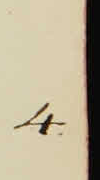4.
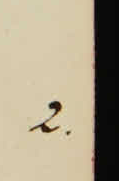2.
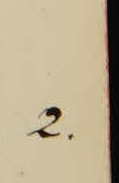2.
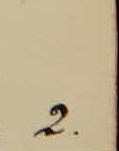2.
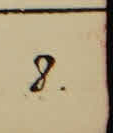8.
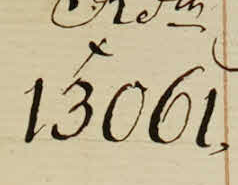13061
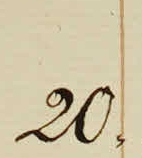20
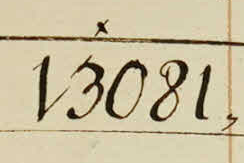13081
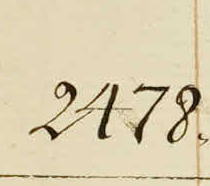2478
